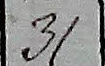31
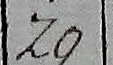29
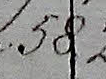58
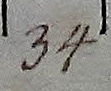34
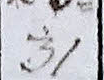31
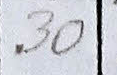30
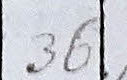36
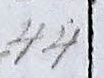44
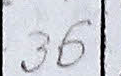35
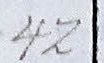42
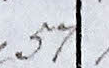57
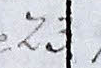23
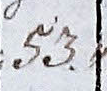53
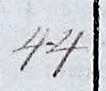44
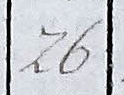26
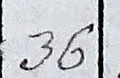36
